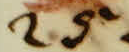25
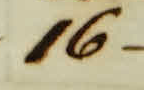16
